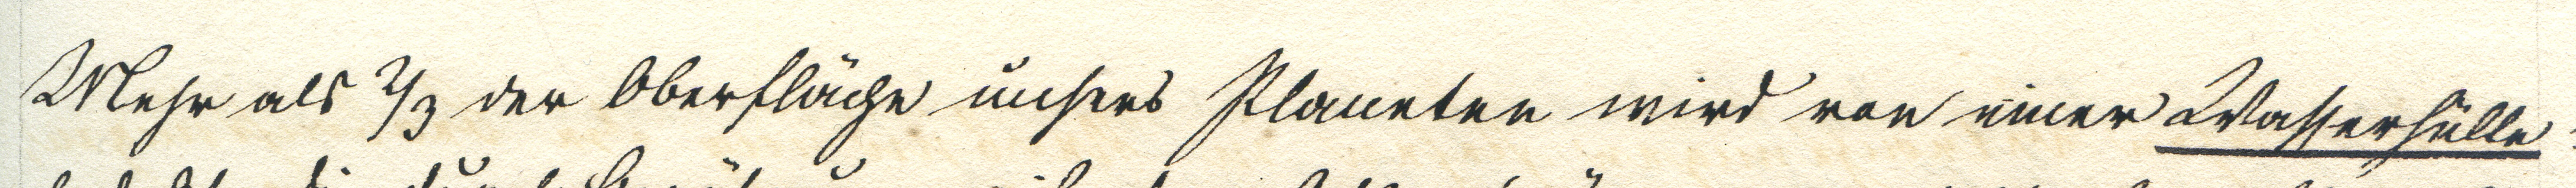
Mehr als ⅔ der Oberfläche unsres Planeten wird von einer Wasserhülle
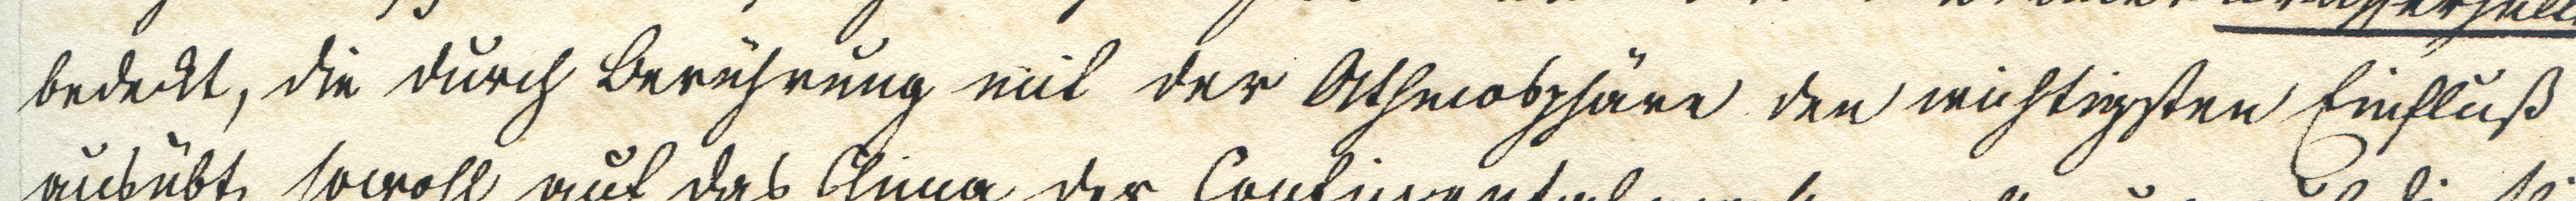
bedeckt, die durch Berührung mit der Athmosphäre den wichtigsten Einfluß
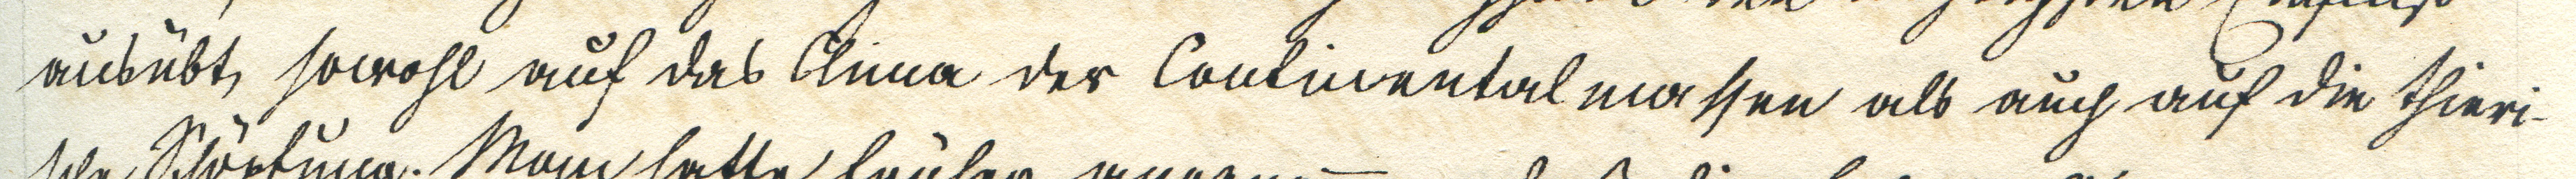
ausübt, sowohl auf das Clima der Continentalmassen als auch auf die thieri-
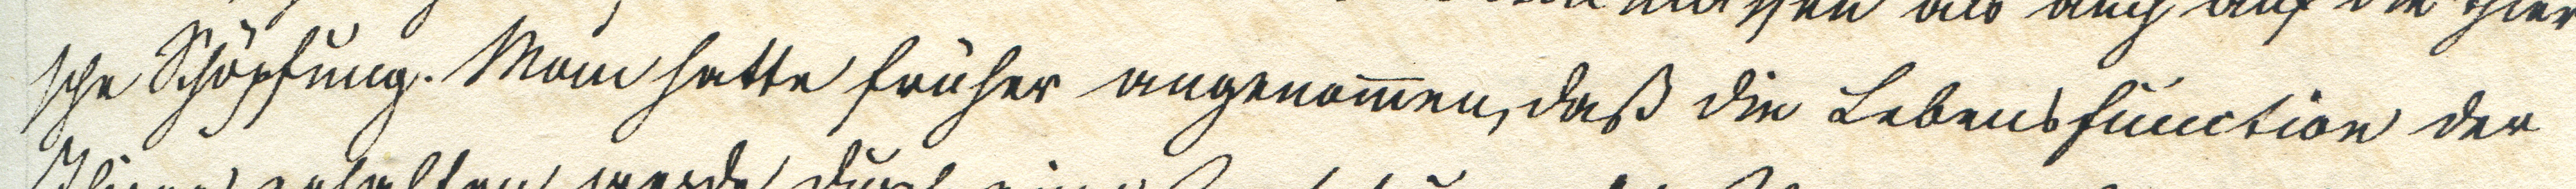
sche Schöpfung. Man hatte früher angenom̃en, daß die Lebensfunction der
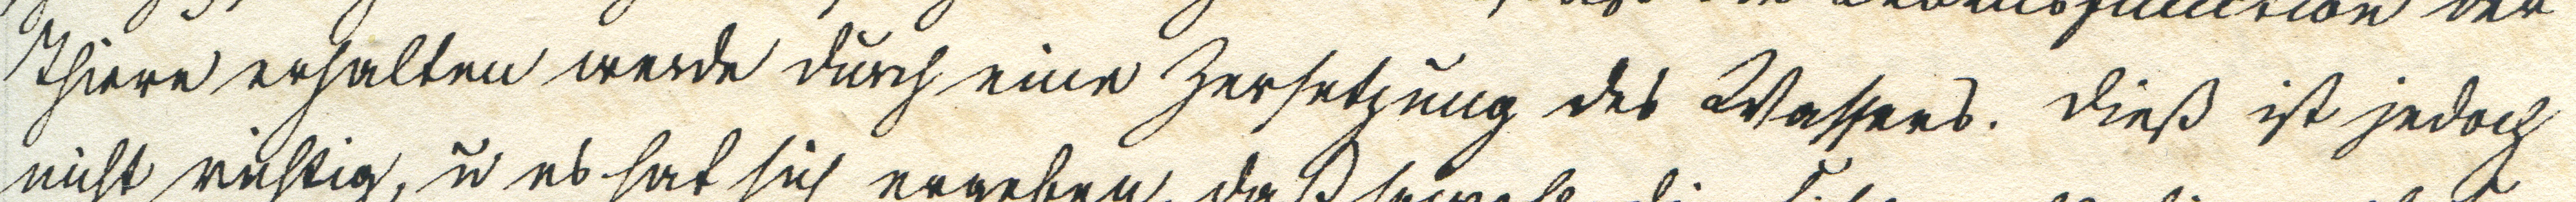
Thiere erhalten werde durch eine Zersetzung des Wassers. Dies ist jedoch
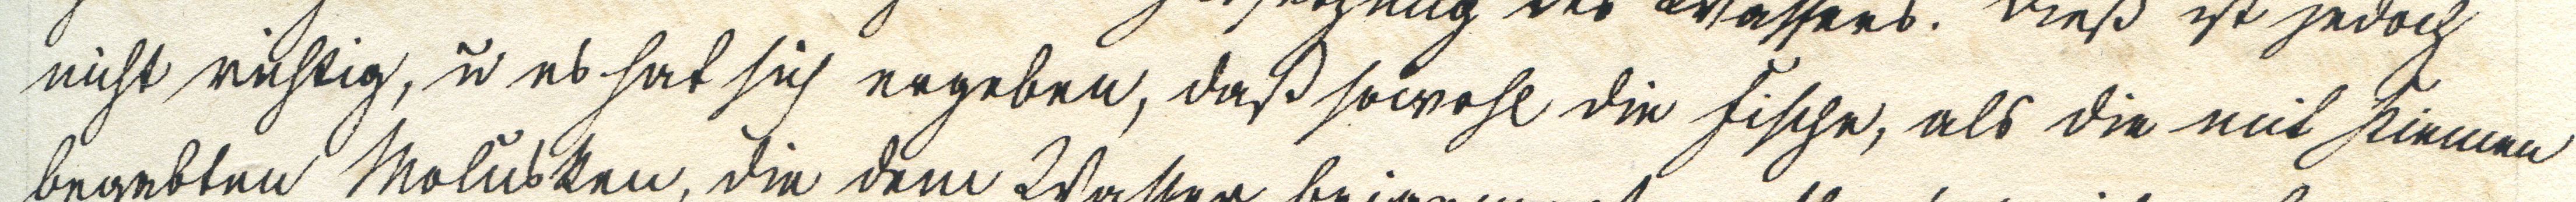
nicht richtig, u es hat sich ergeben, daß sowohl die Fische, als die mit Kiemen
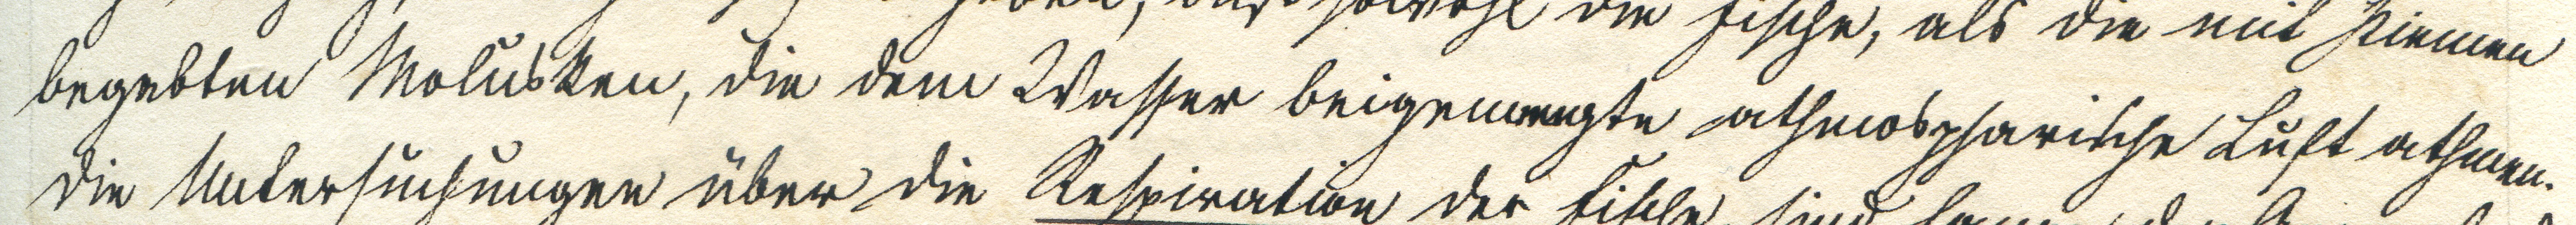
begabten Molusken, die dem Wasser beigemengte atmosphärische Luft athmen.
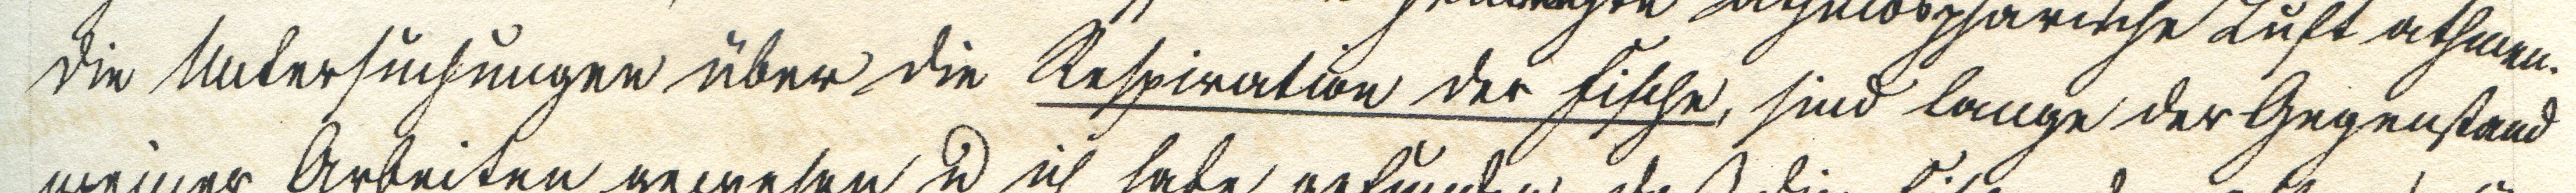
Die Untersuchungen über die Respiration der Fische, sind lange der Gegenstand
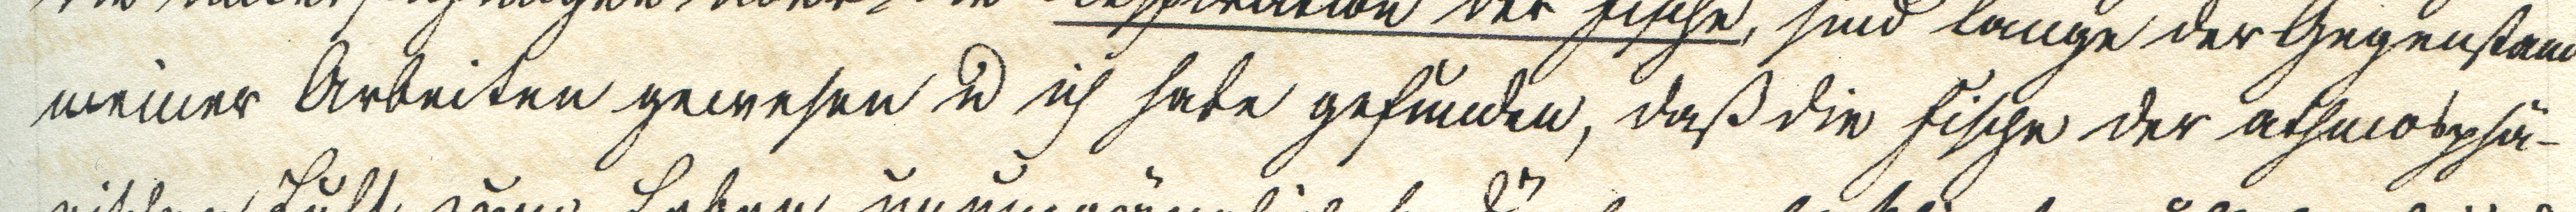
meiner Arbeiten gewesen u ich habe gefunden, daß die Fische der athmosphä-
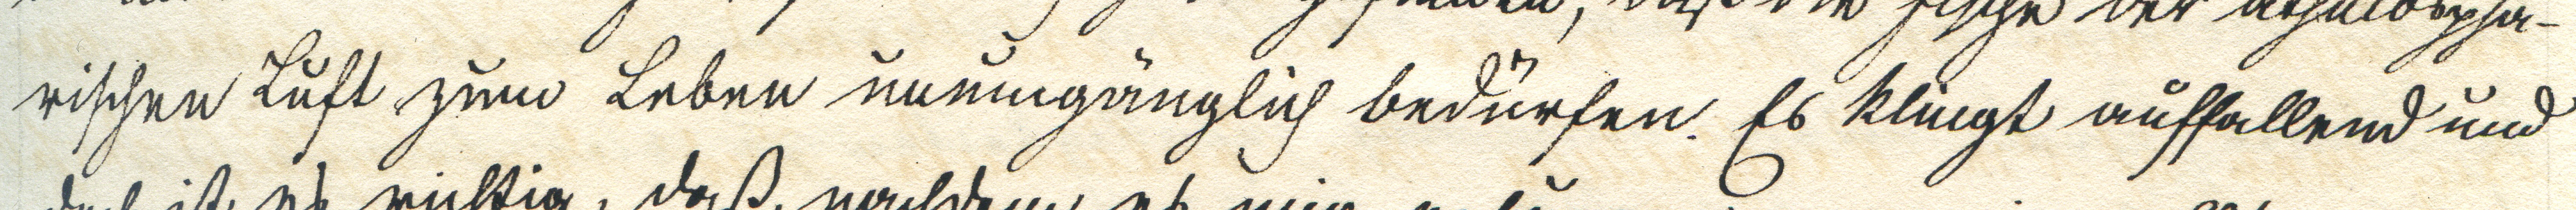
rischen Luft zum Leben unumgänglich bedürfen. Es klingt auffallend und
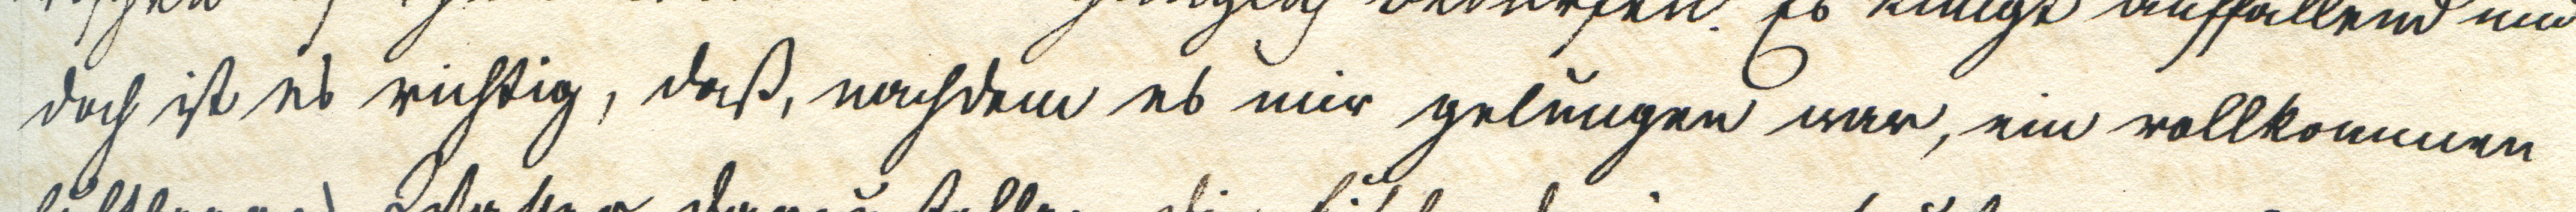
doch ist es richtig, daß, nachdem es mir gelungen war, ein vollkommen
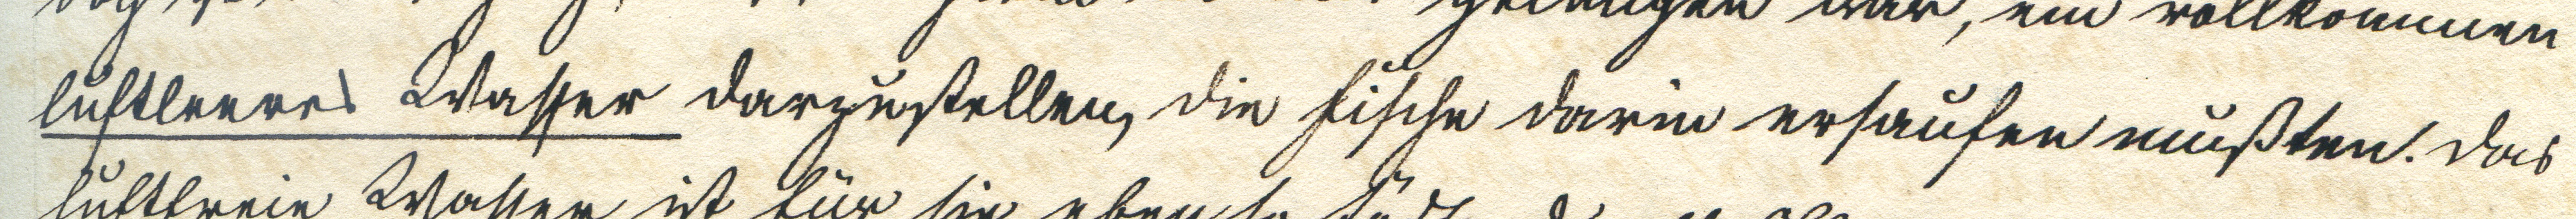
luftleeres Wasser darzustellen, die Fische darin ersaufen mußten. Das
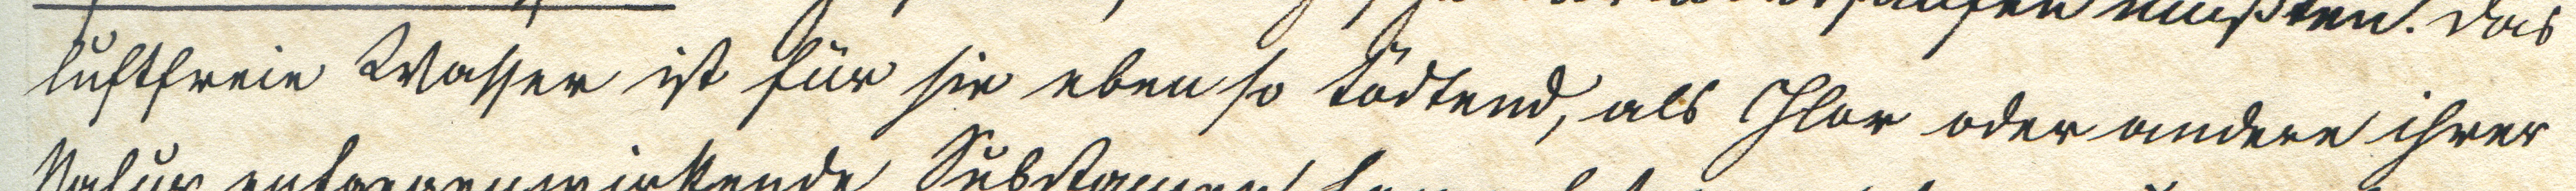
luftfreie Wasser ist für sie eben so tödtend, als Chlor oder andere ihrer
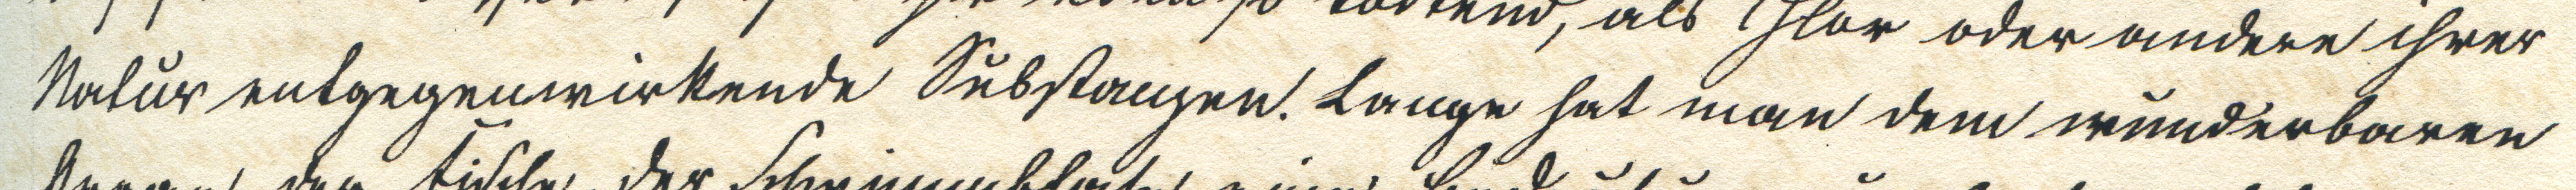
Natur entgegenwirkende Substanzen. Lange hat man dem wunderbaren
